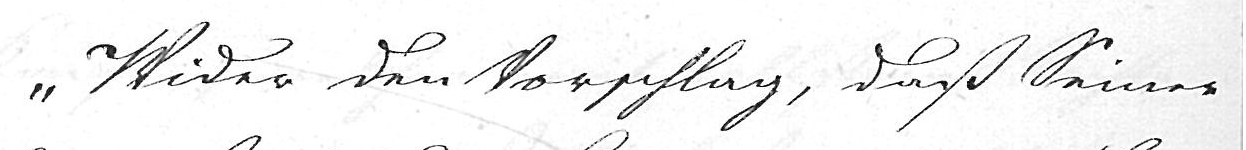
"Wider den Vorschlag, daß Seine
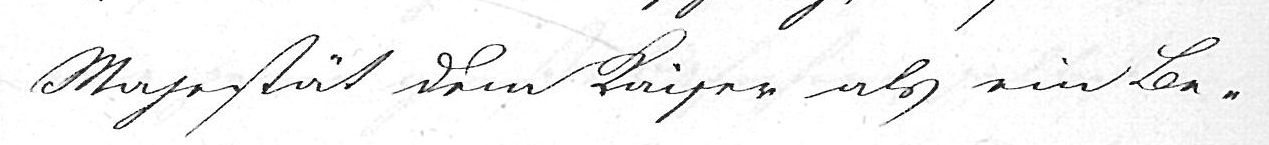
Majestät dem Kaiser als ein Be-
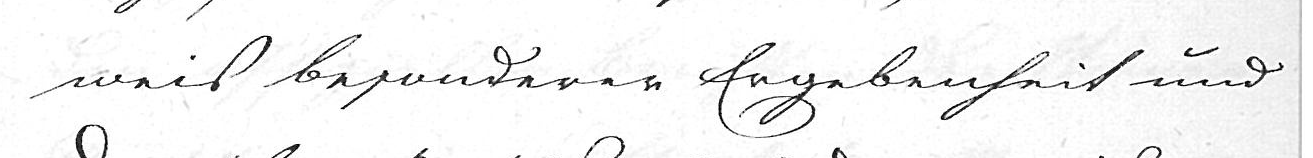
weis besonderer Ergebenheit und
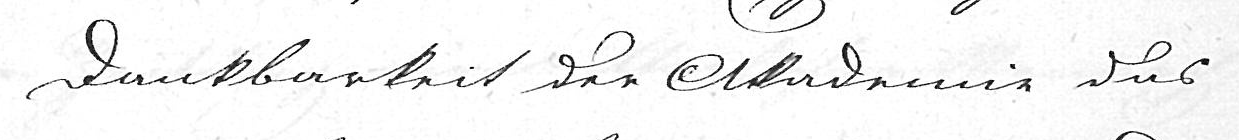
Dankbarkeit der Akademie das
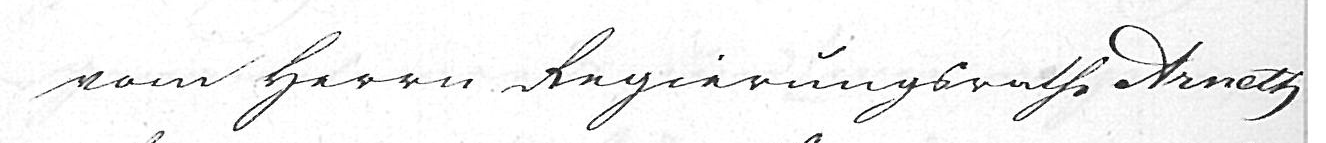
vom Herrn Regierungsrath Arneth
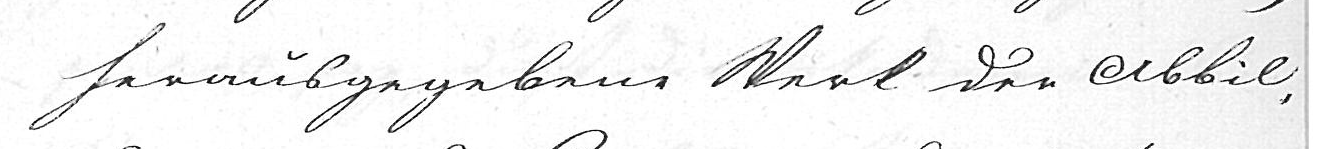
herausgegebene Werk der Abbil-
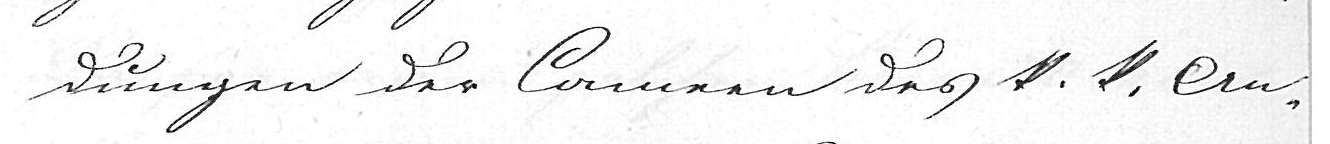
dungen der Cameen des k. k. An-
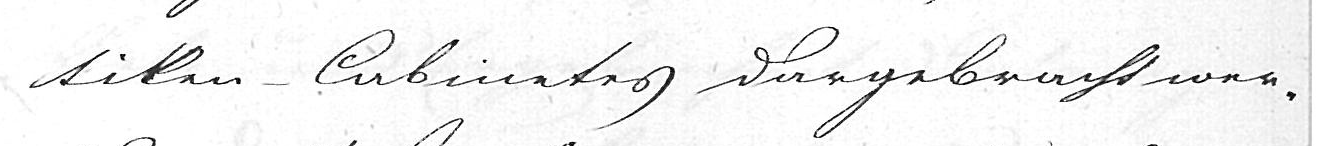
tiken-Cabinetes dargebracht wer-
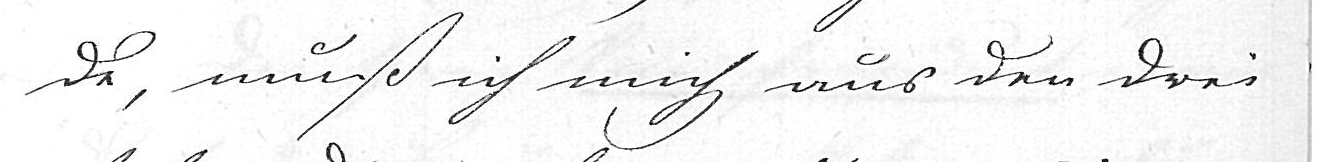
de, muß ich auch aus den drei
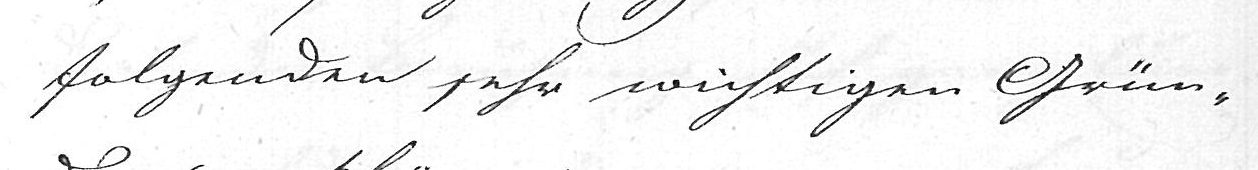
folgenden sehr wichtigen Grün-
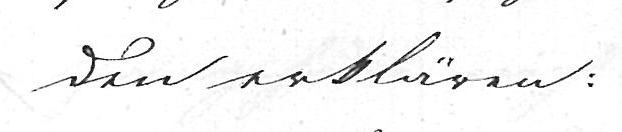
den erklären:
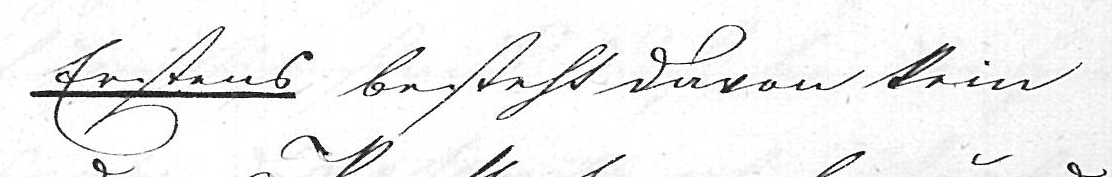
Erstens besteht daven kein
